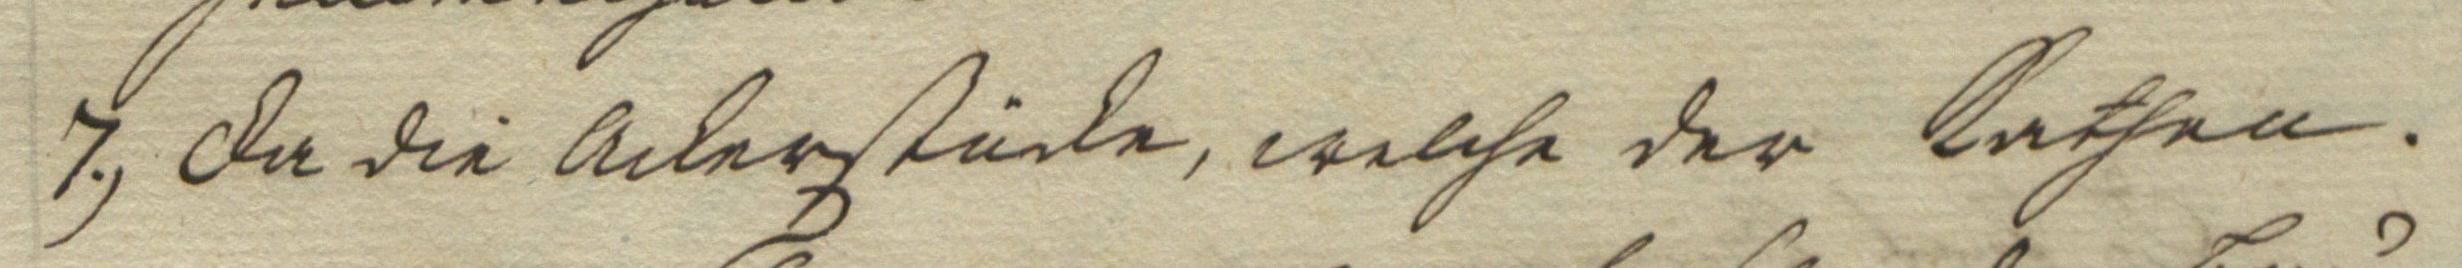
7., Da die Ackerstücke, welche der Kathen¬
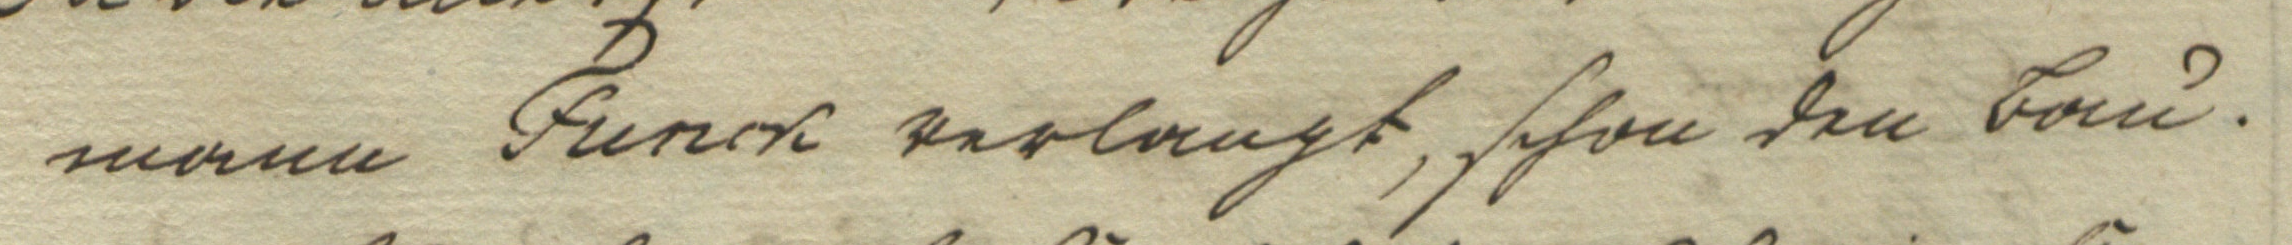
mann Funck verlangt, schon den Bau¬
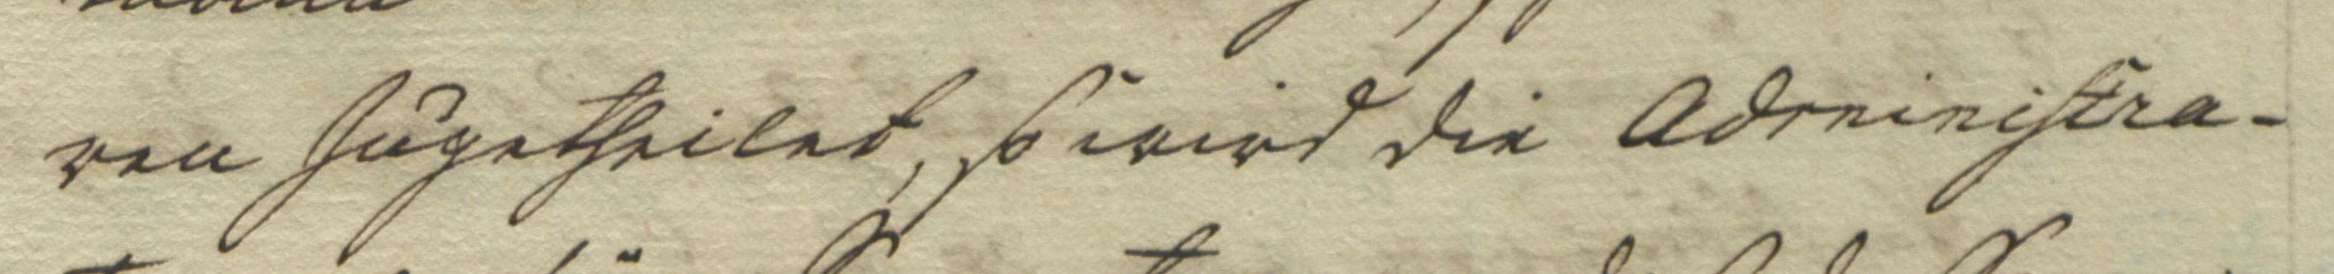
ren zugetheilet, so wird die Administra¬
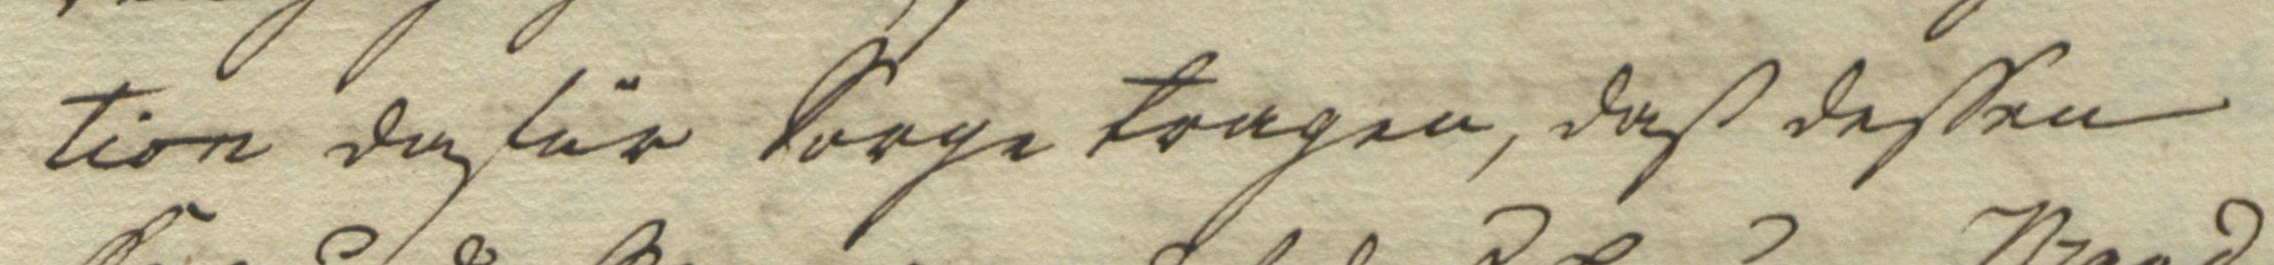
tion dafür Sorge tragen, daß dessen
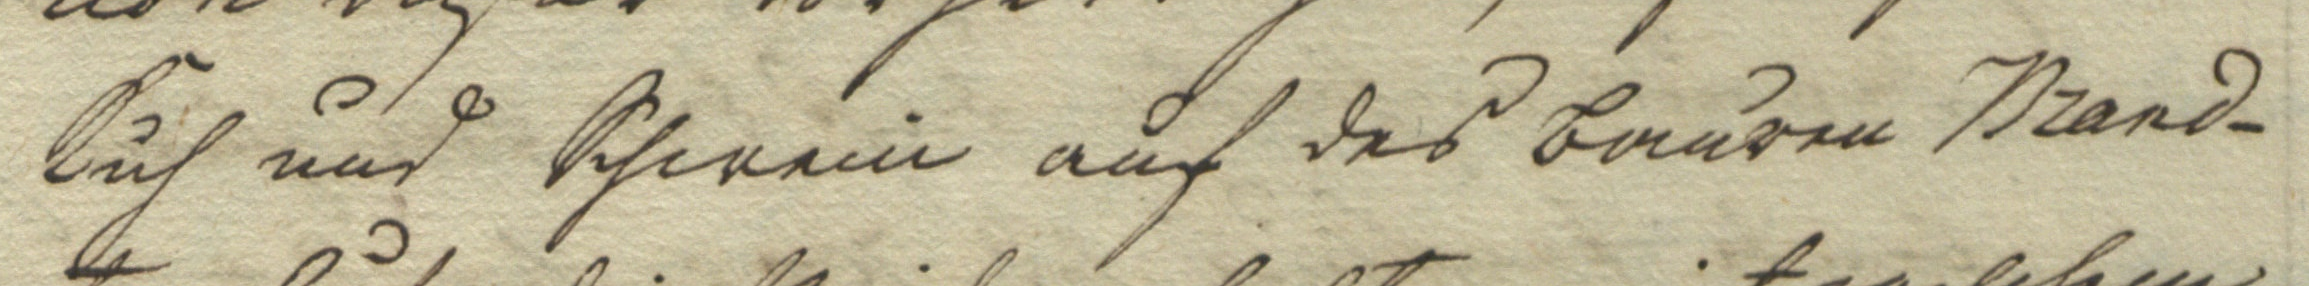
Kuh und Schwein auf des Bauren Brand¬
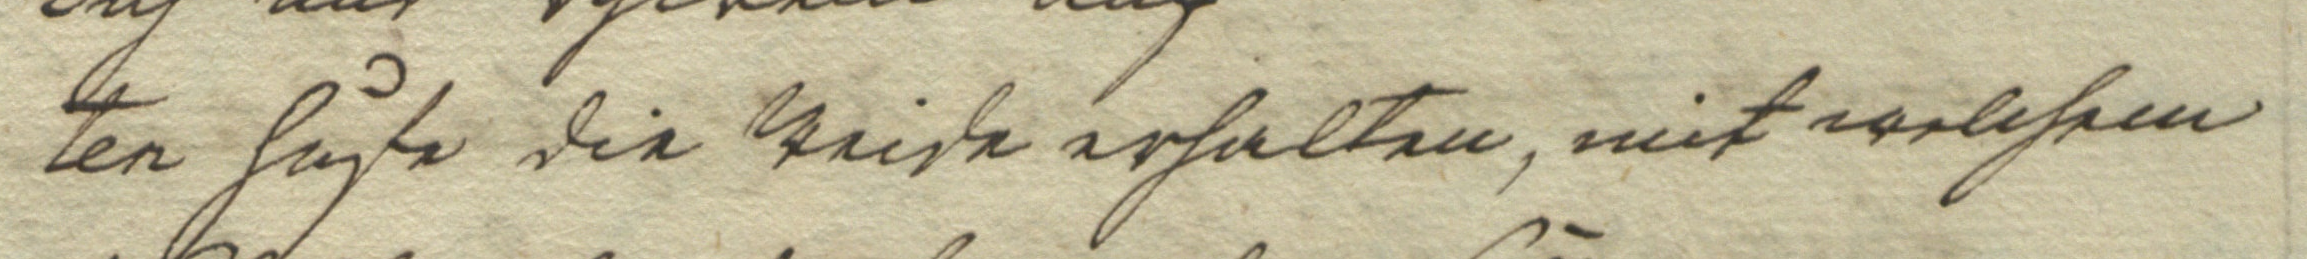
ten Hufe die Weide erhalten, mit welchem
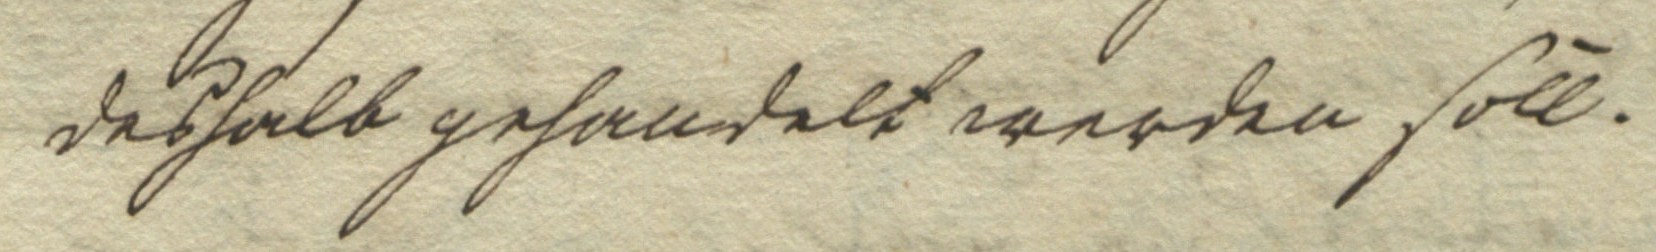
deshalb gehandelt werden soll.
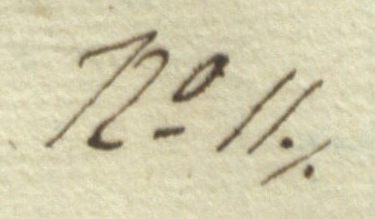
No 11.
